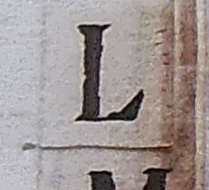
L
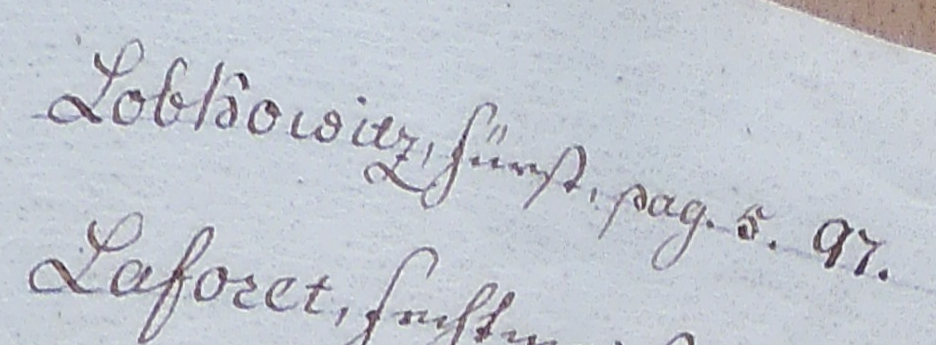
Lobkowitz, Fürst, pag. 5. 97.
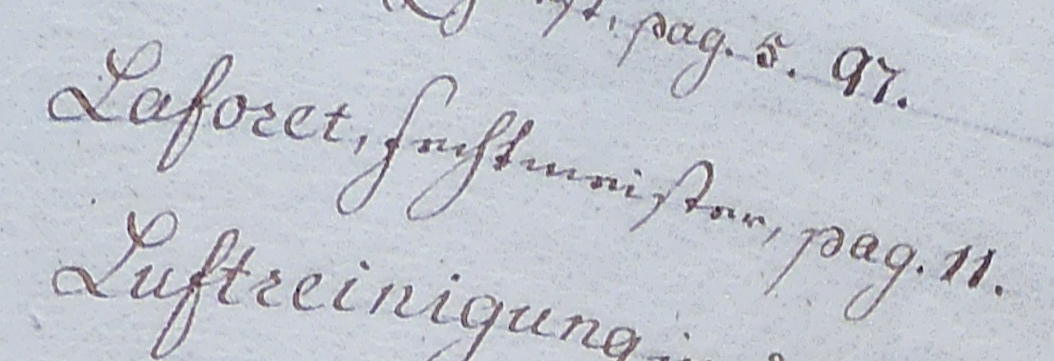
Laforet, Fechtmeister, pag. 11.
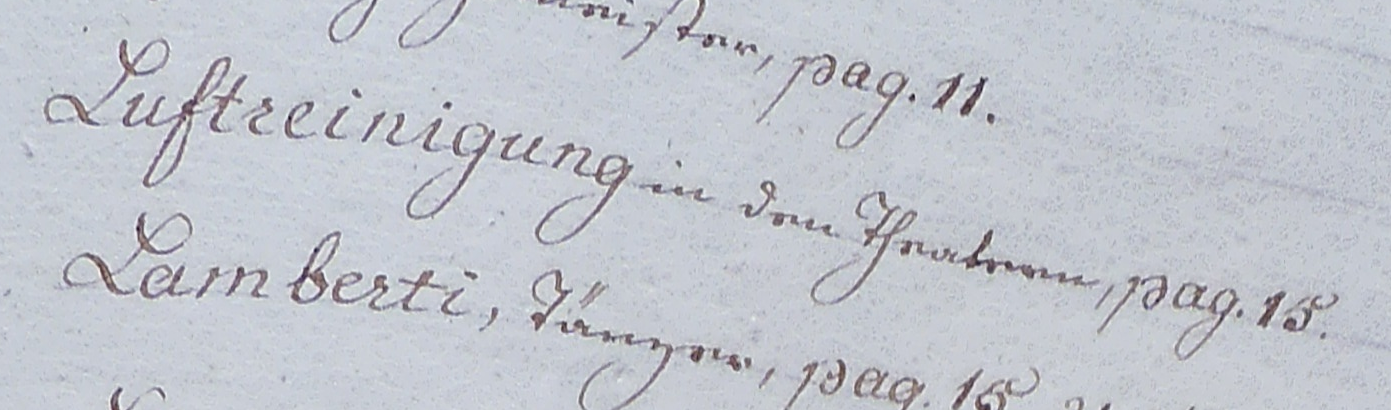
Luftreinigung in den Theatern, pag. 15.
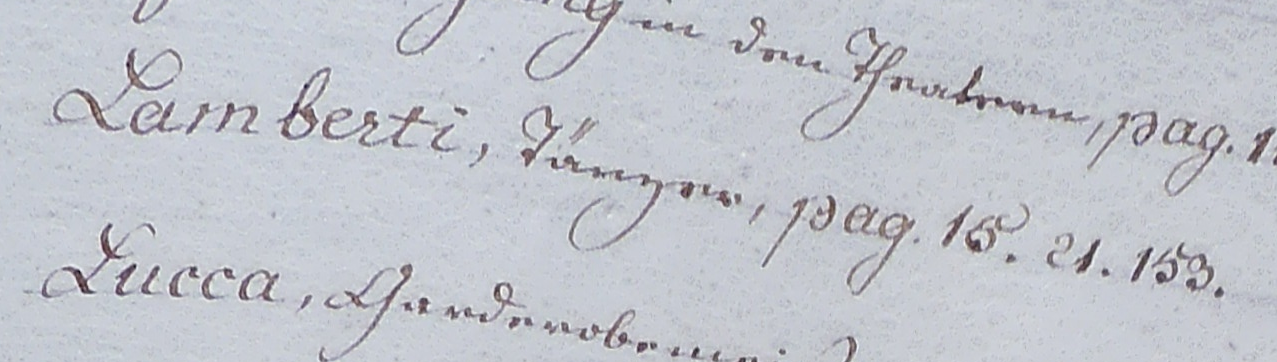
Lamberti, Tänzer, pag. 15. 21. 153.
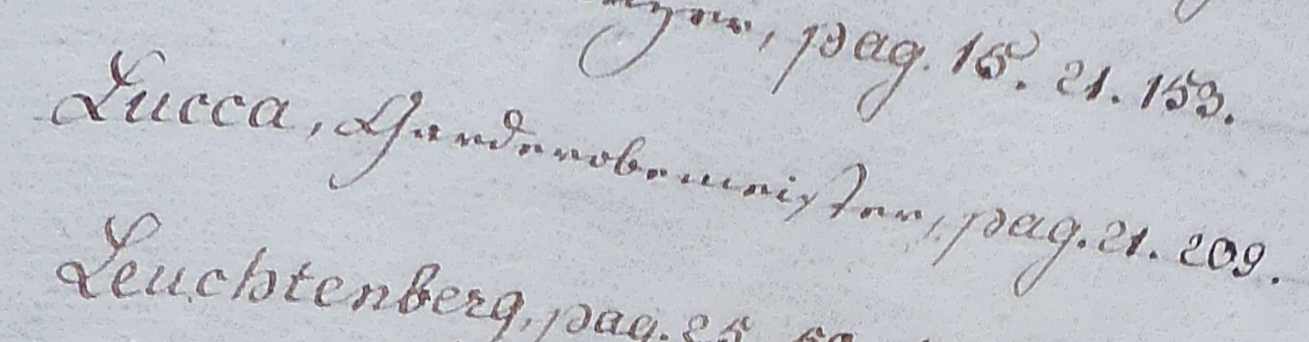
Lucca, Garderobemeister, pag. 21. 209.
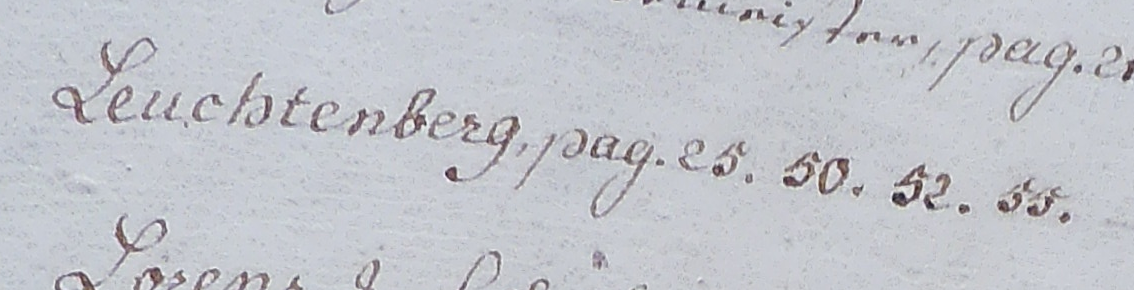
Leuchtenberg, pag. 25. 50. 52. 55.
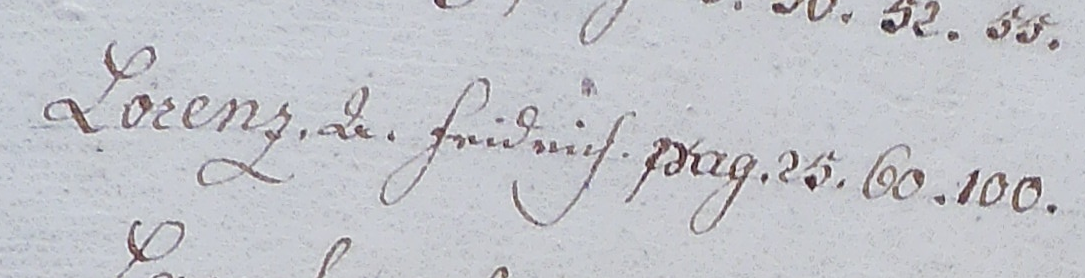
Lorenz, A. Fridrich. pag. 25. 60 100.
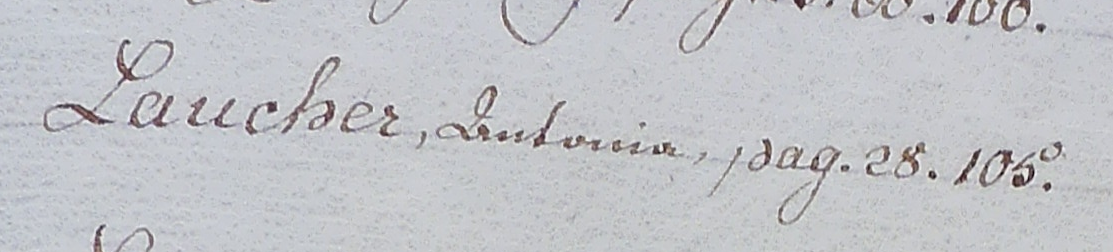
Laucher, Antonia, pag. 28. 105.
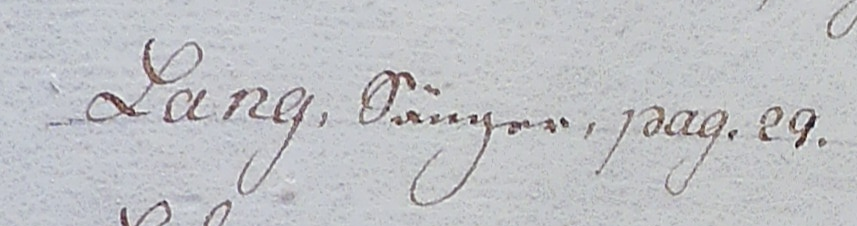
Lang, Sänger, pag. 29.
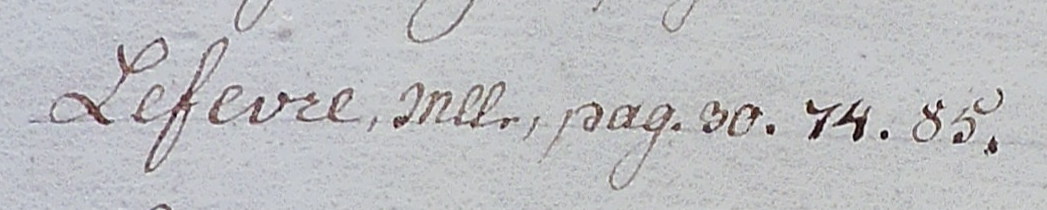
Lefevre, Mlle, pag. 30. 74. 85.
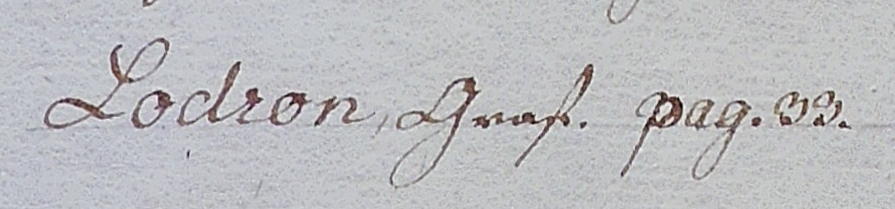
Lodron, Graf. pag. 33.
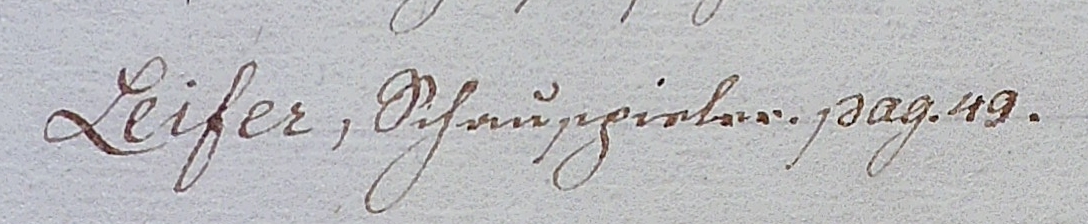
Leifer, Schauspieler. pag. 49.
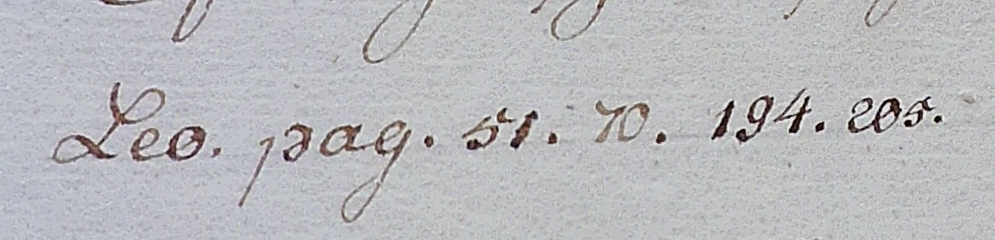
Leo. pag. 51. 70. 194. 205.
